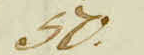50.
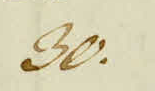30.
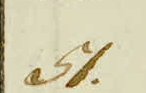51.
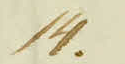14.
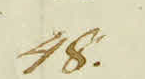48.
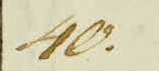40.
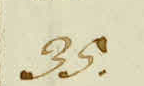25.
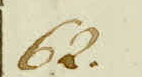62.
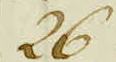26
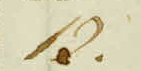12.
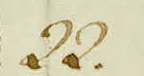22.
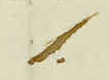1.
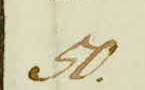50.
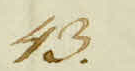43.
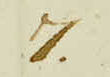7.
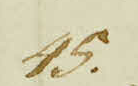45.
